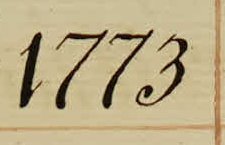1773
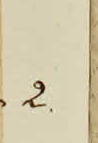2.
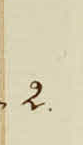2.
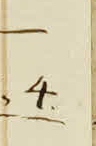4.
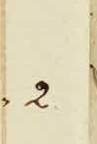2.
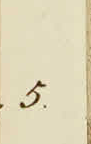5.
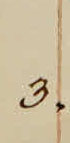3
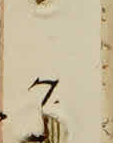7.
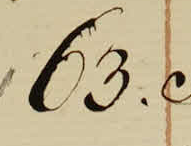63.
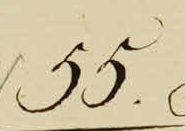55.
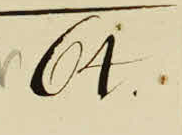64.
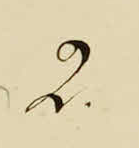2.
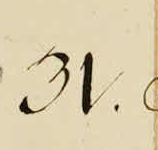31.
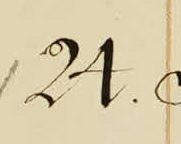24.
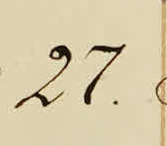27.
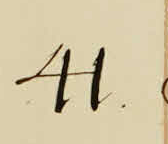41.
